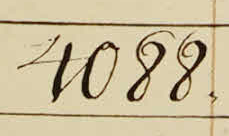4088
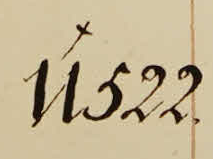11522
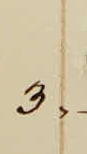3
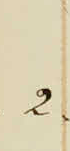2
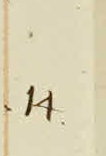14.
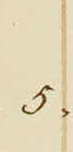5
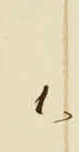1
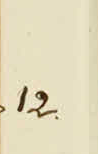12.
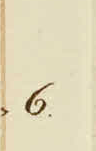6.
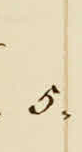5
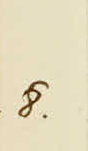8.
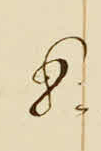8
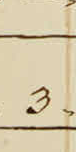3
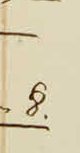8.
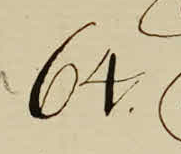64.
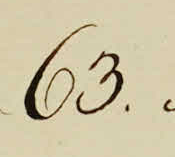63.
